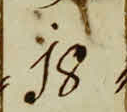18
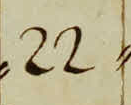22
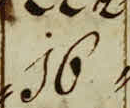16
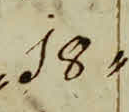18
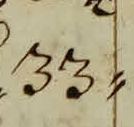33
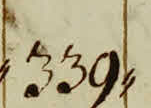339
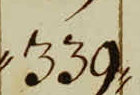339
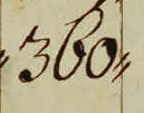360
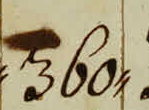360
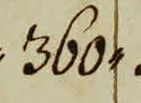360
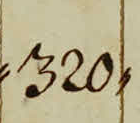320
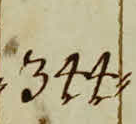344
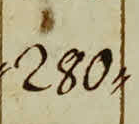280
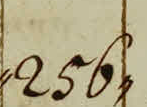256
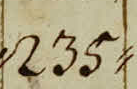235
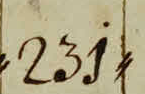231
